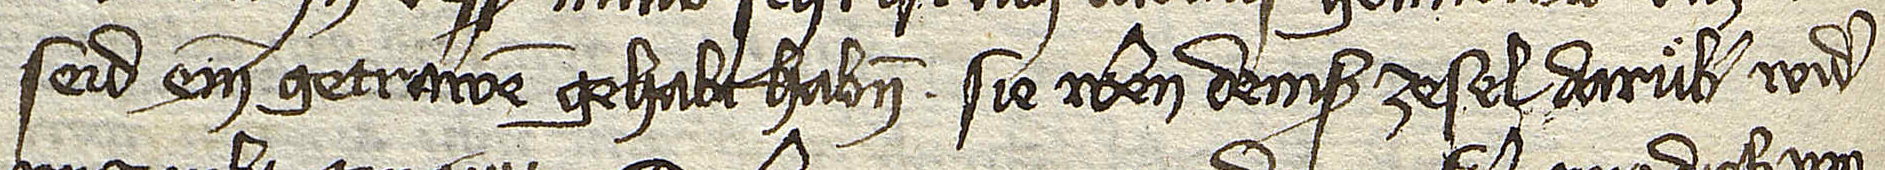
ſeid ein* getrawe* gehabt habn* . ſie w*en demſ* ʒefel darüb* wid*
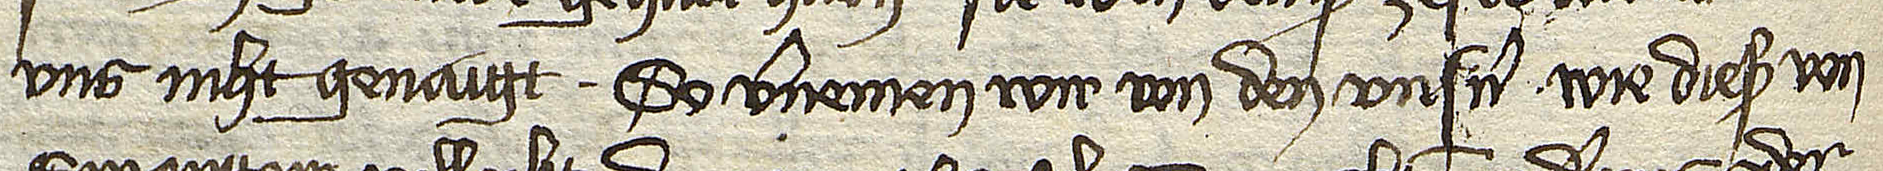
vns niht genaigt / So v*nemen wir von den vnſn* . wie dieſ* von
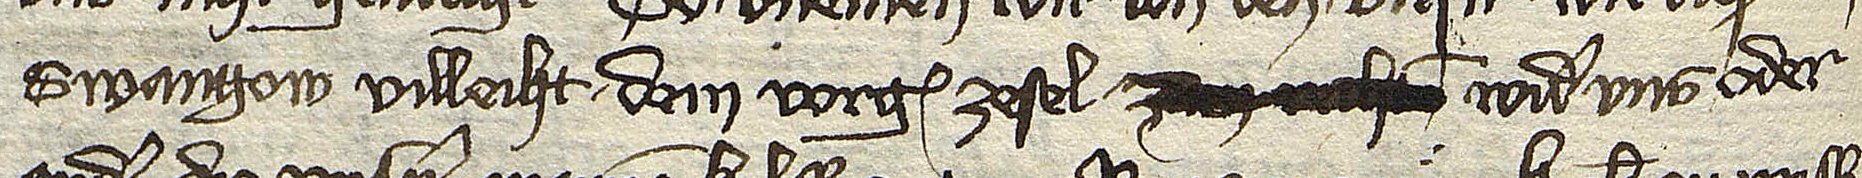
Swangow villeiht / dem vorg* ʒefel ʒum rechte* wid* vns oder
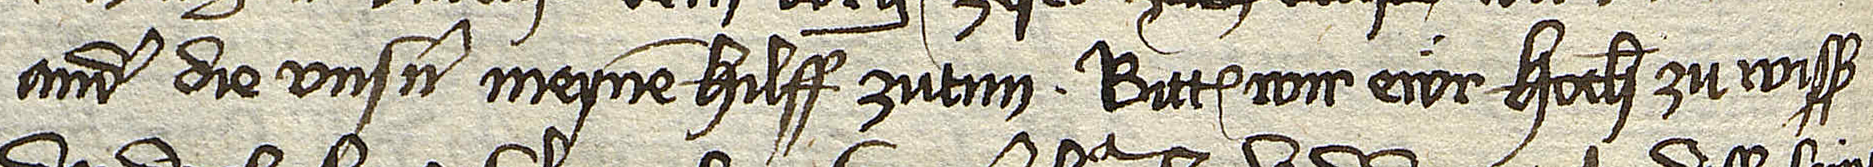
and* die vnſn* meyne* hilff ʒutun . Bitt* wir eẅr hoch* ʒu wiſſ*
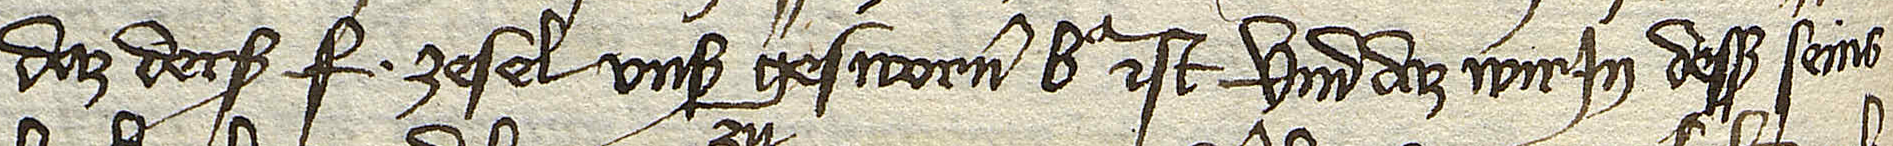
Daʒ derſ* . f . ʒeſel vnſ* geſworn* b* iſt Vnd daʒ wir In deſſ* ſeins
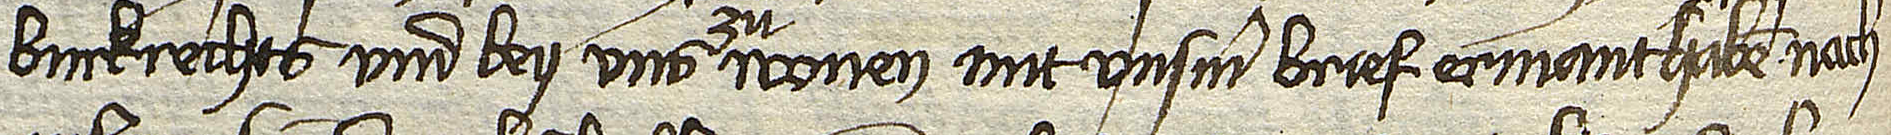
burkrechts vnd bey vns wonen mit vnſm* brief ermant habe* nach
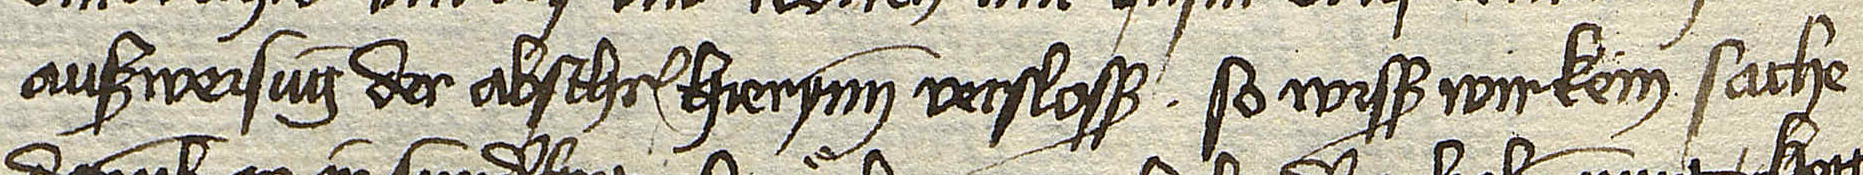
auſʒweiſu*g der abſchr* hierynn* verſloſſ* . ſo wiſſ* wir kein ſache
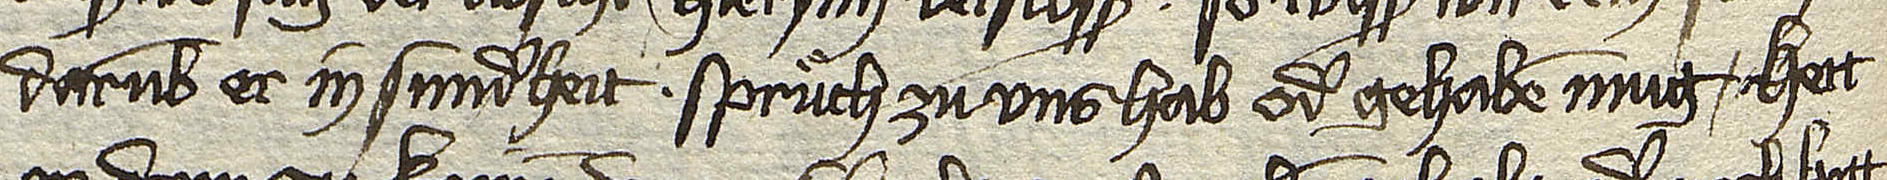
darub* er in ſund*heit . ſprüch ʒu vns hab od* gehabe* mug / Hett
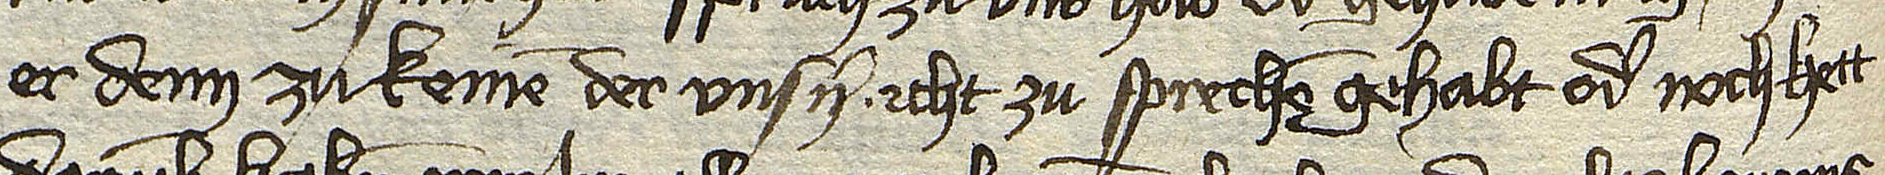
er denn ʒu keine* der vnſn* . icht ʒu ſpreche* gehabt od* noch hett
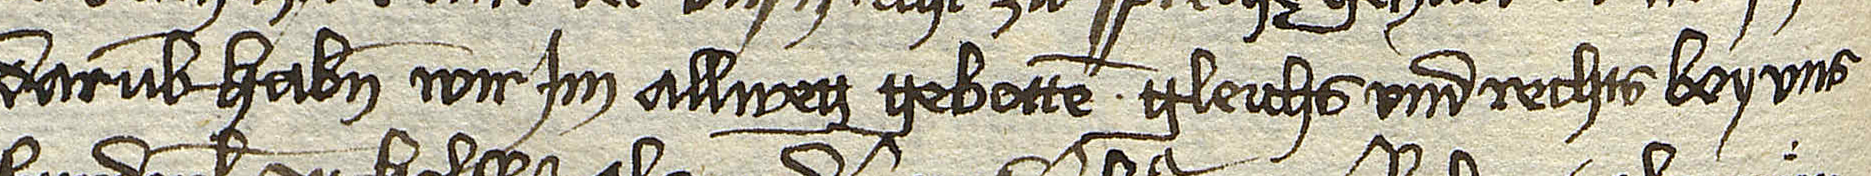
Darub* habn* wir Im allweg gebotte* . gleichs vnd rechts bey vns
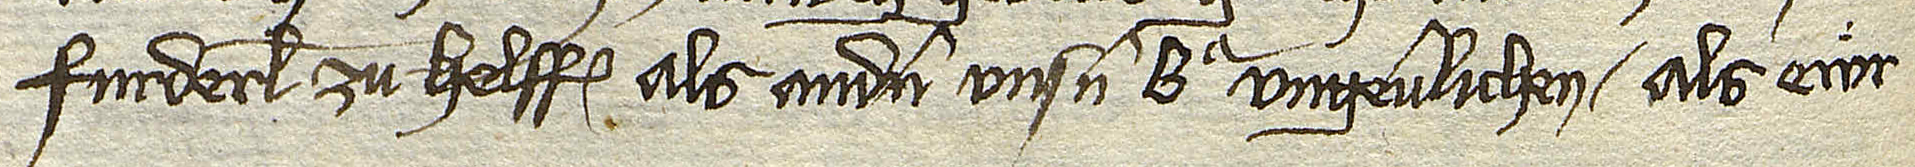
furderl* ʒu helff* als andn* vnſn* b* vngeu*lichen / als eẅr
